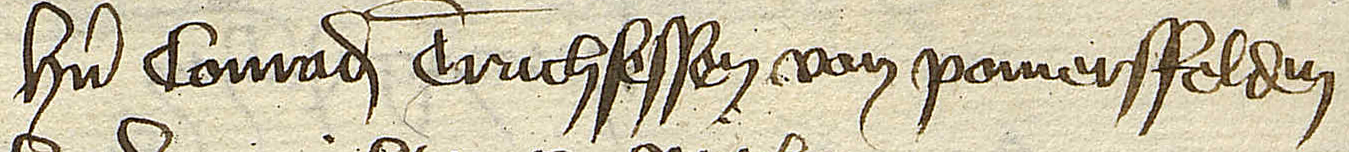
h*n Conrad* Truchſeſſen von pomerſfelden
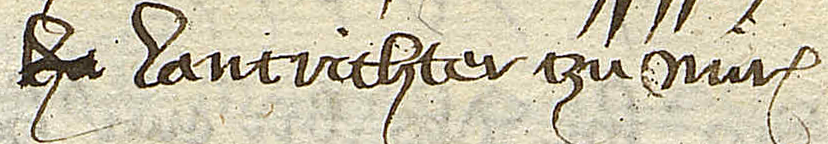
hn lantrichter cʒu Nür*
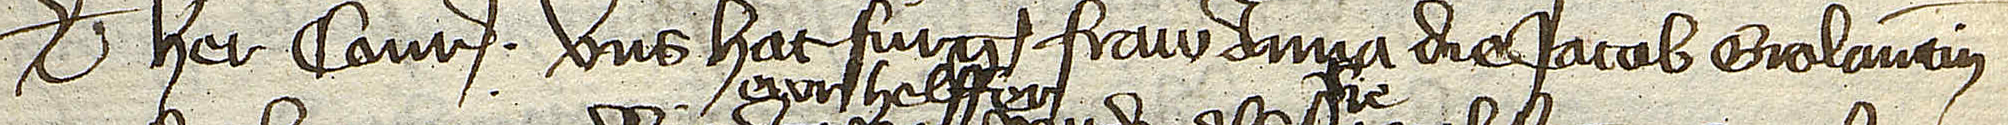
L* her Conr* . Vns hat fürg* fraw Anna die Iacob Grolantin
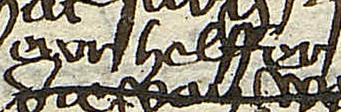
ewr helffer
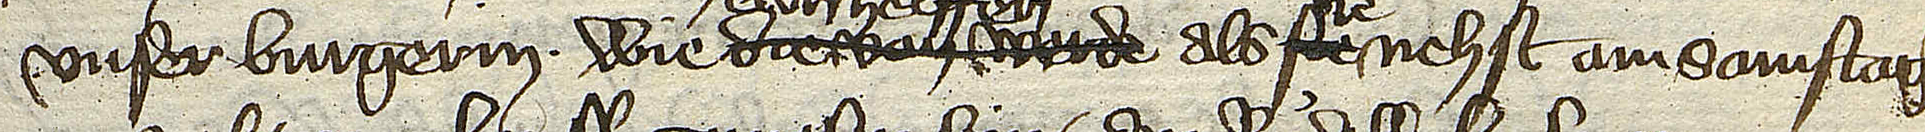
vnſer burgerin . wie die von werde Als ſie nehſt am Samſtag*
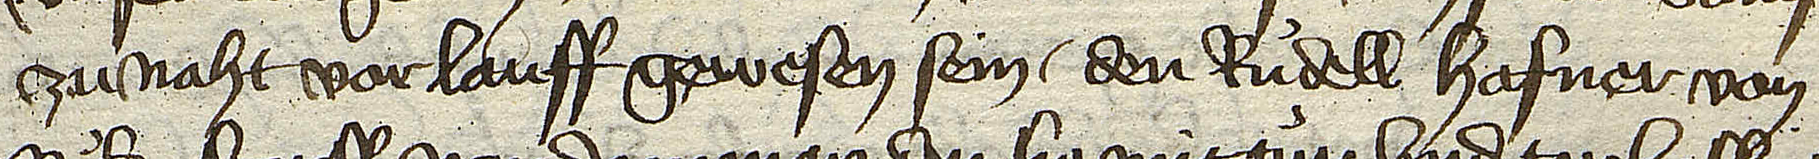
cʒu Naht vor lauff geweſen ſein / den Rüdell hafner von
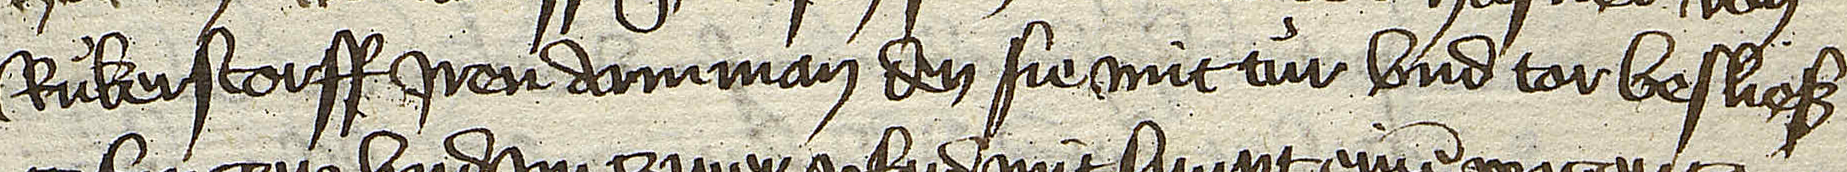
Rükerſtorff Iren Armman den ſie mit tür vnd tor beſlieſʒ
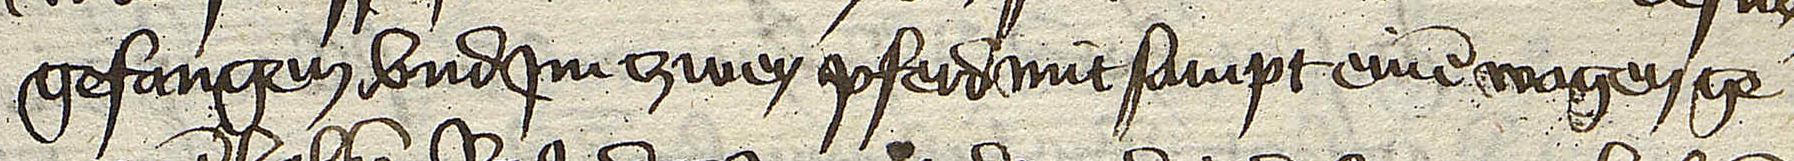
gefangen vnd Im cʒwey pferd mitſampt eine* wagen ge
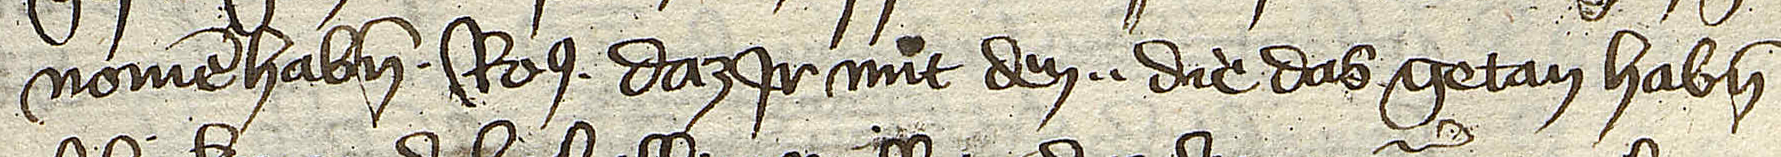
nome* hab*n . Rog* . daʒ Ir mit den ~ die das getan hab*n
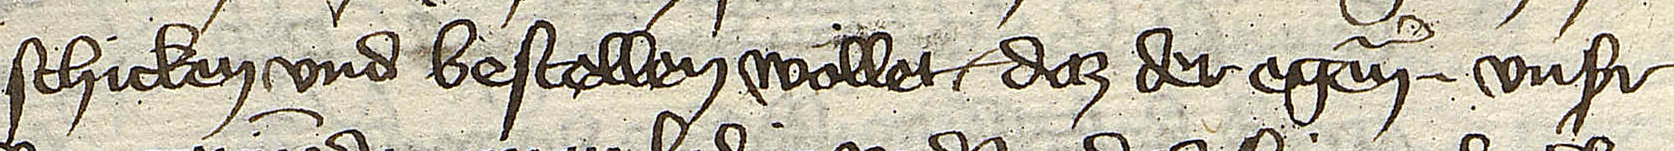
ſchicken vnd beſtellen wöllet / daʒ der egen* ~ vnſ*r
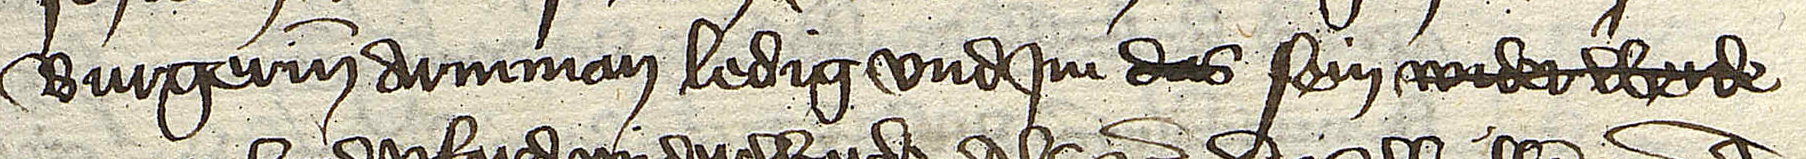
Burgerin* Armman ledig vnd Im das ſein wider werde
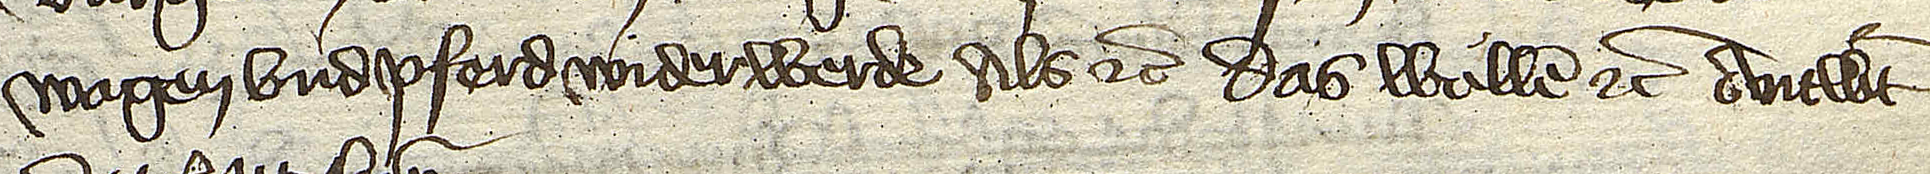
wagen vnd pferd wider werde Als ec* das wölle* ec* Antw*t
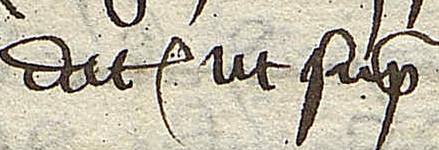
dat* ut ſup*
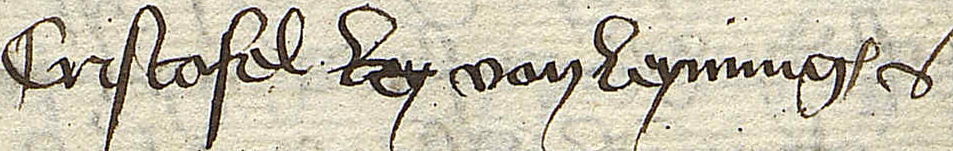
Criſtofel ley von leyming*
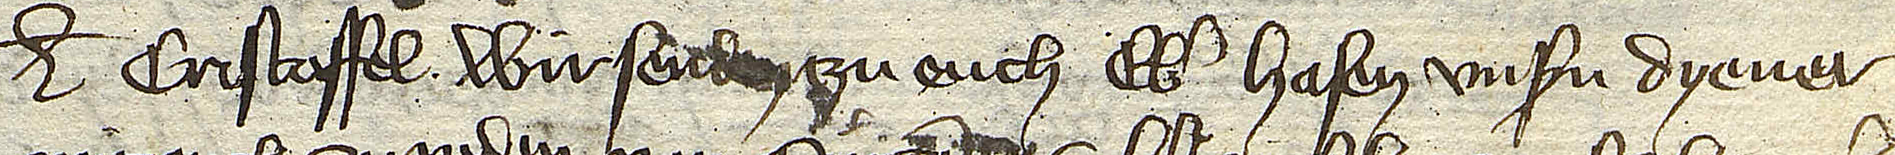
L* Criſtoffel . Wir ſenden cʒu euch Eb* haſen vnſ*n dyener
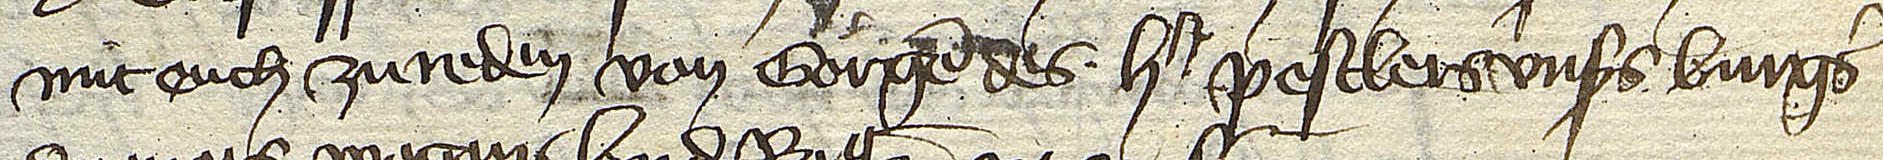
mit euch cʒu reden von Görge* des h* peſtlers vnſ*s burgs*
